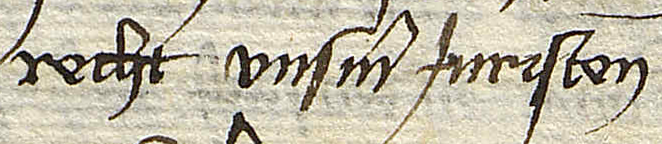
recht vnſm* Iuriſten
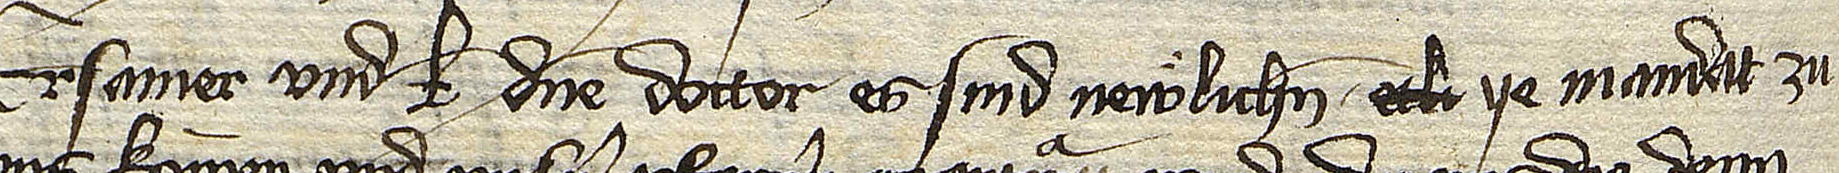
Erſamer vnd L* dne* doctor es ſind neẅlichn* / etl* ye mandat ʒu
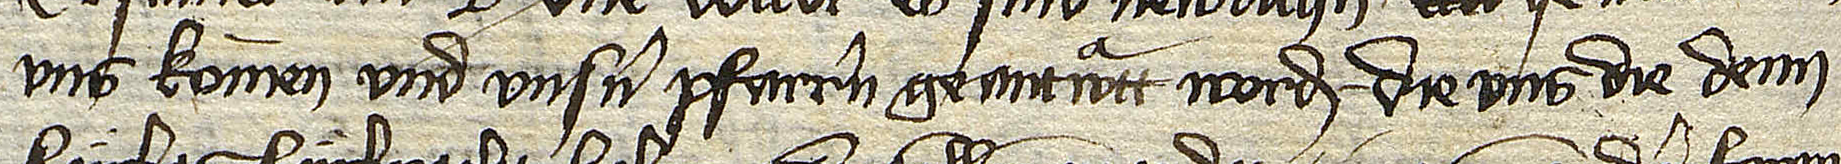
vns kom*en vnd vnſn* pfarr*n geantw*tt word* - Die vns die denn
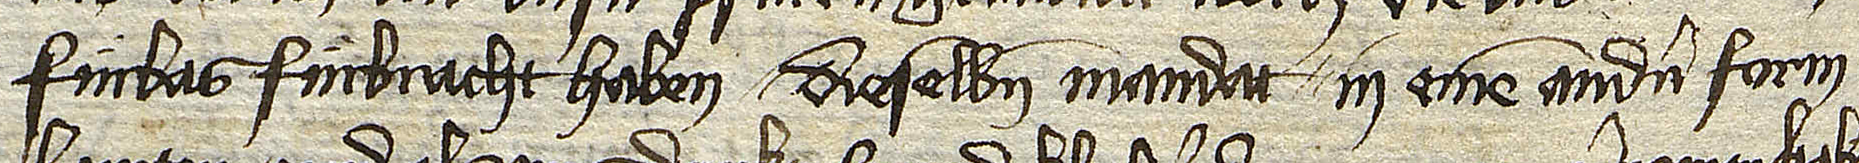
fürbas fürbracht haben / Dieſelbn* mandat / in eine* andn* form
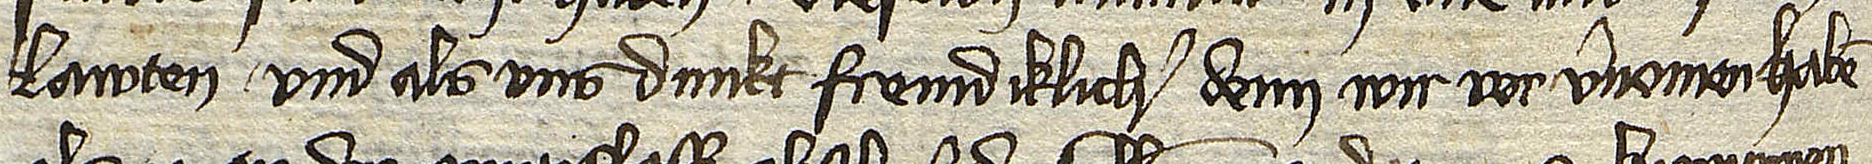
lawten / vnd als vns dunkt fremdiklich* denn wir vor v*nomen habe*
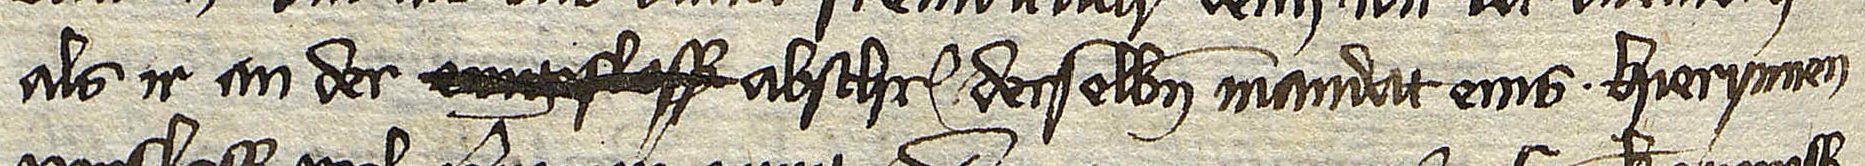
als ir an der eingeſloſſ* abſchr* / derſelbn* mandat eins . Hierynnen
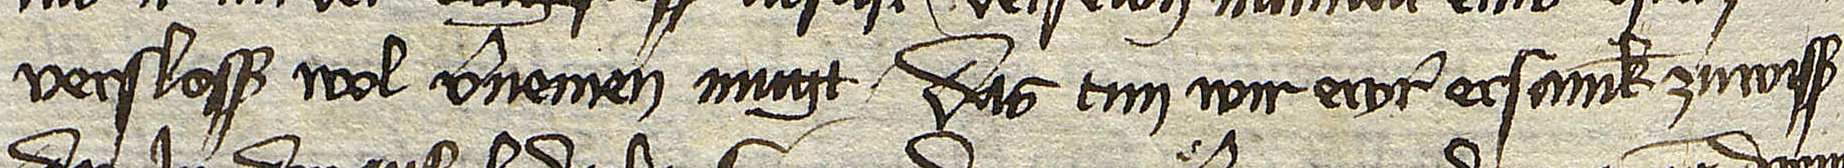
verſloſſ* wol v*nemen mugt / Das tun wir ewr* erſamk* ʒuwiſſ*
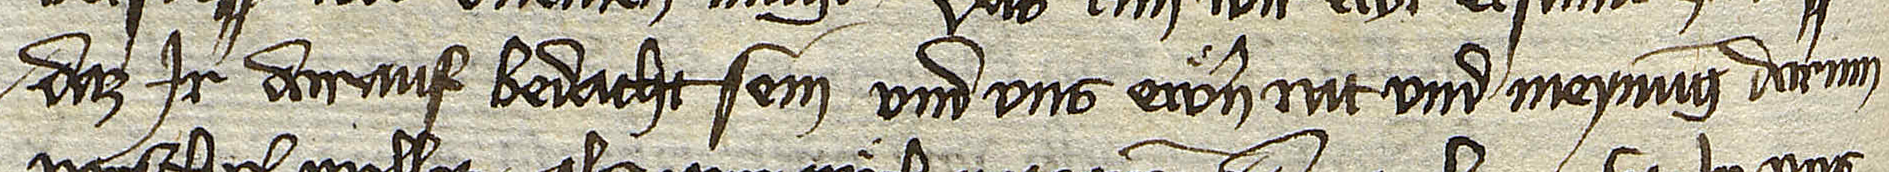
/ Daʒ Ir darauff bedacht ſein vnd vns eẅ*n rat vnd meynu*g darinn
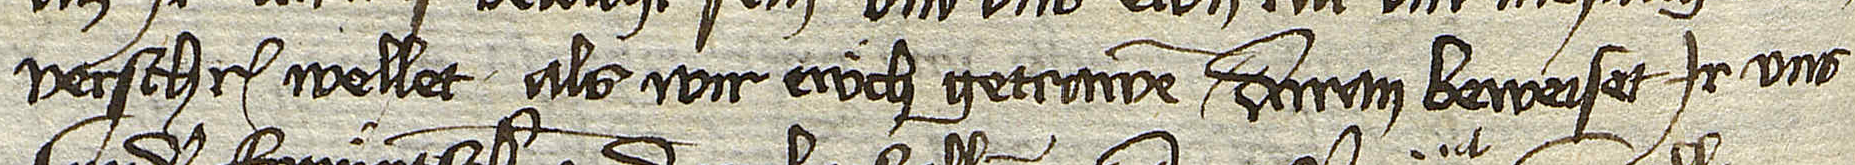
verſchr* wellet / als wir eẅch getrawe* / Daran beweiſet Ir vns
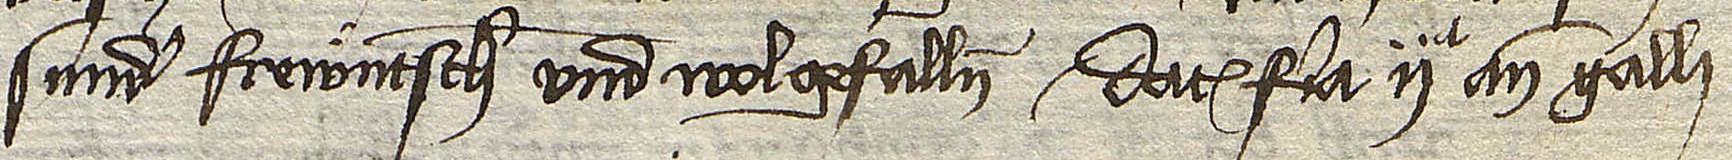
ſund* freẅntſch* vnd wolgefalln* / Dat* fi*a ii* an* galli
